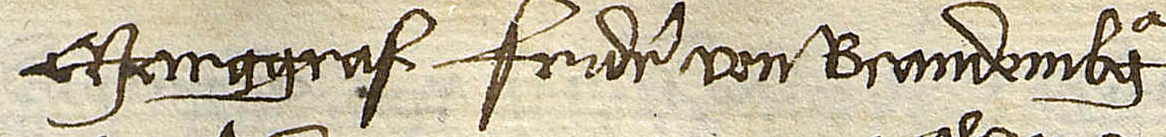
Marggraf Fridr* von Brandembg*
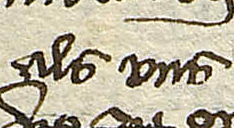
als vns
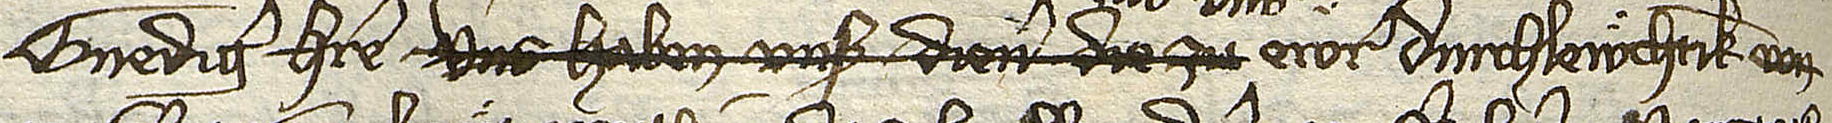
Gnedig* h*re Vns haben vnſ* / dien* die ʒu ew*r durchlewchtik* von
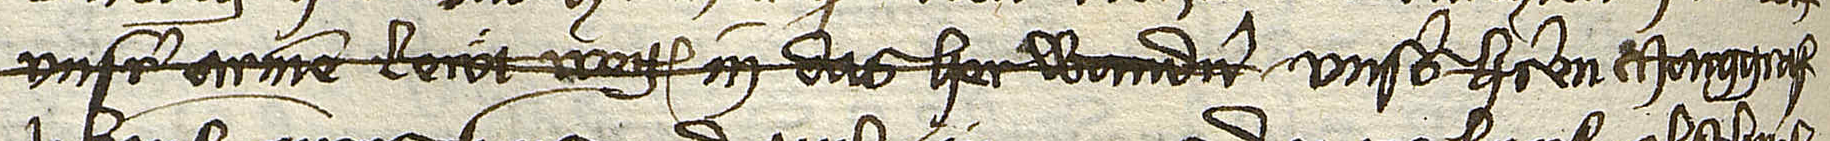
vnſ*r arme* lewt weg* in das her wand*n / vnſ*s h*ren Marggraf
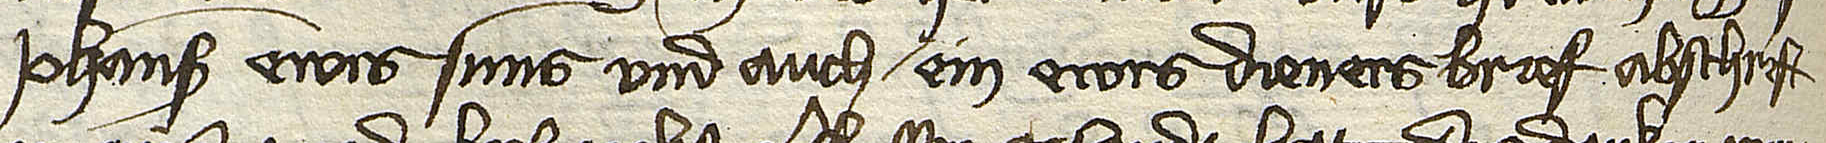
Iohanſ* ewrs ſuns vnd auch / ein ewrs dieners brief abſchrift
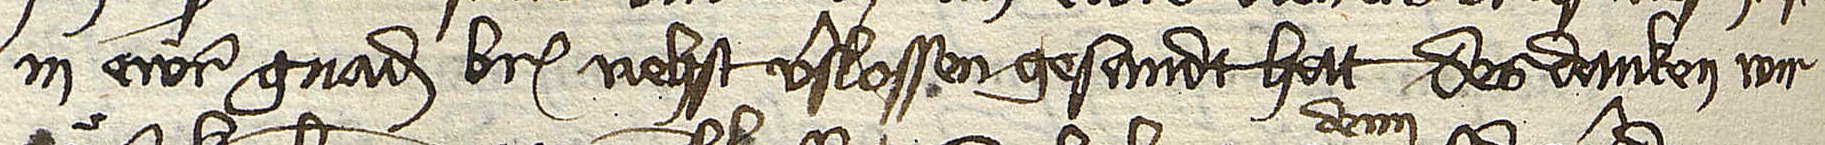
in ew*r gnad* br* nehſt v*ſloſſen geſandt hat / des danken wir
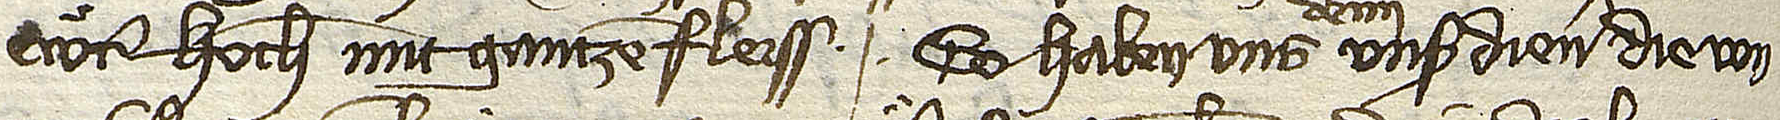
ew*r hoch* mit gancʒe* fleiſſ . / . So haben vns vnſ* dien* die von
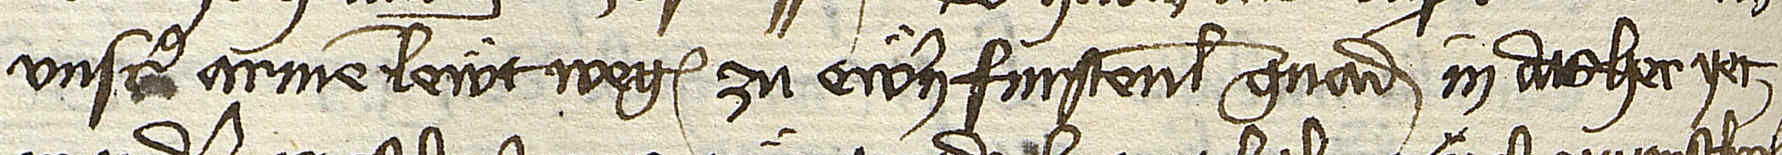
vnſ*r arme* lewt weg* ʒu ew*n fürſtenl* gnad* in das her yecʒ
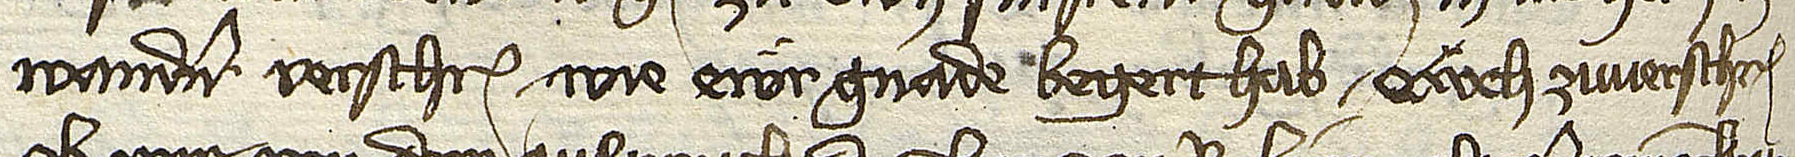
wand*n verſchr* / wie ewr gnade begert hab / ewch ʒuuerſchr*
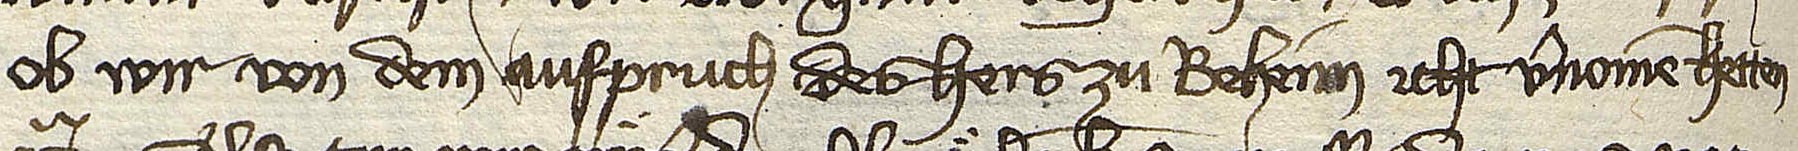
ob wir von dem aufpruch / des hers ʒu Beheim icht v*nome* hetten
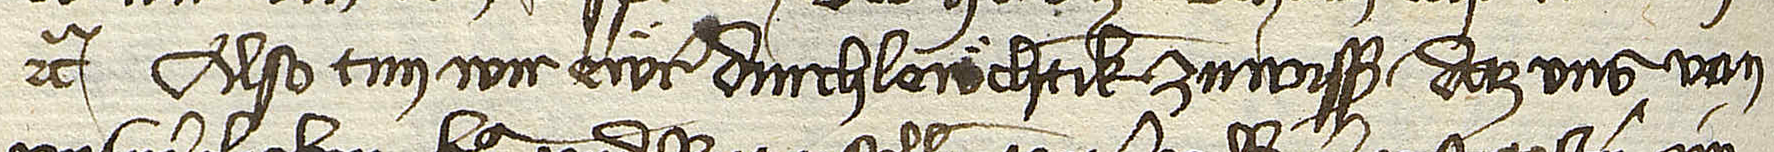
ec* Alſo tun wir ew*r durchlewchtik* ʒuwiſſ* / daʒ vns von
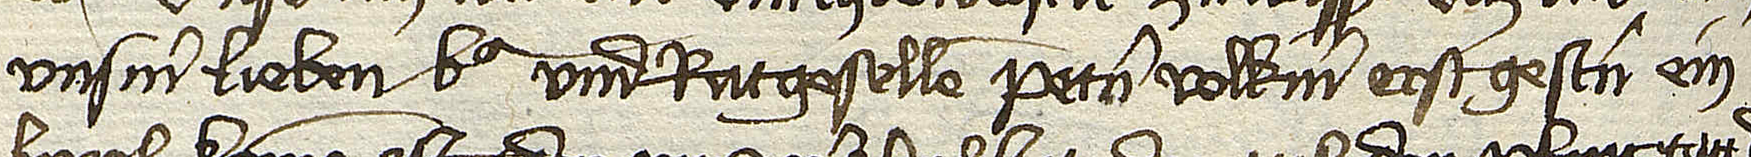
vnſ*m lieben b* vnd Ratgeſelle* pet*n volkm* erſt geſt*n ein
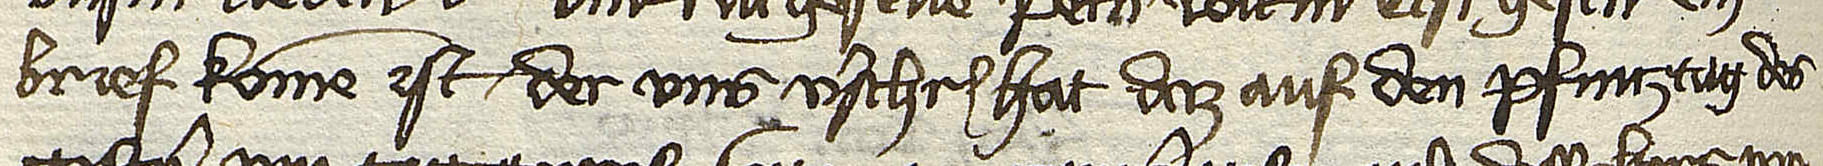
brief kome* iſt / der vns v*ſchr* hat daʒ auf den Pfincʒtag des
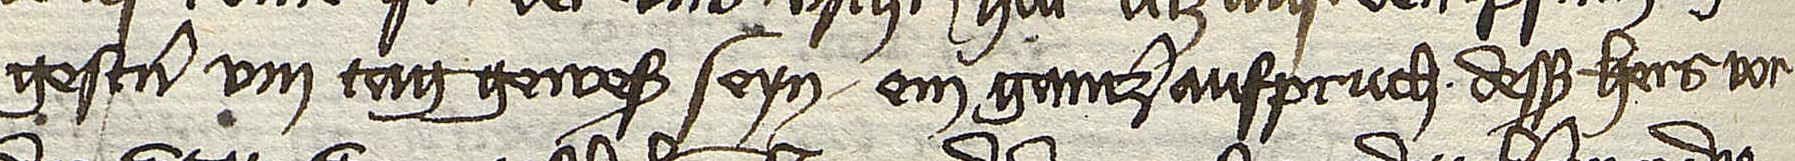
geſt*n viii tag geweſ* ſeyn / ein gancʒ* aufpruch . deſſ* hers vor
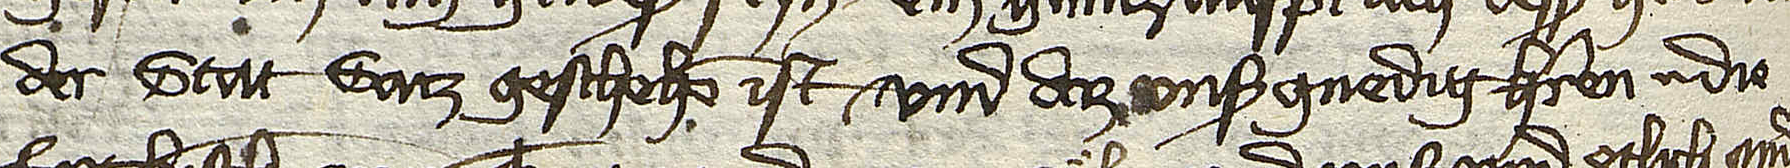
der Stat Sacʒ geſchehe* iſt / vnd daʒ vnſ* gnedig h*ren ~die
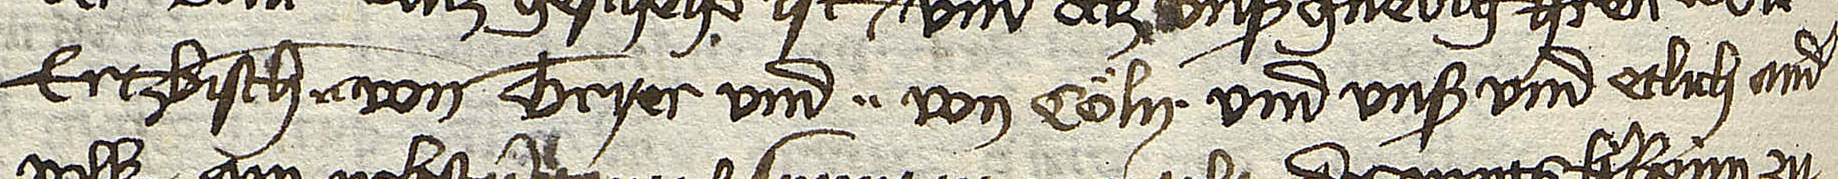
Ercʒbiſch* ~ von Tryer vnd ~ von Cöln . vnd vnſ* vnd etlich and*
